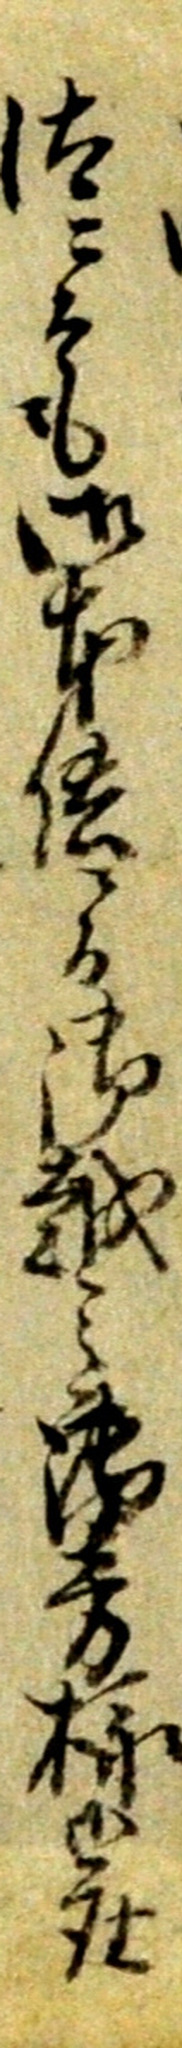汰ニ而も御本供ニ而御越之御方様御座
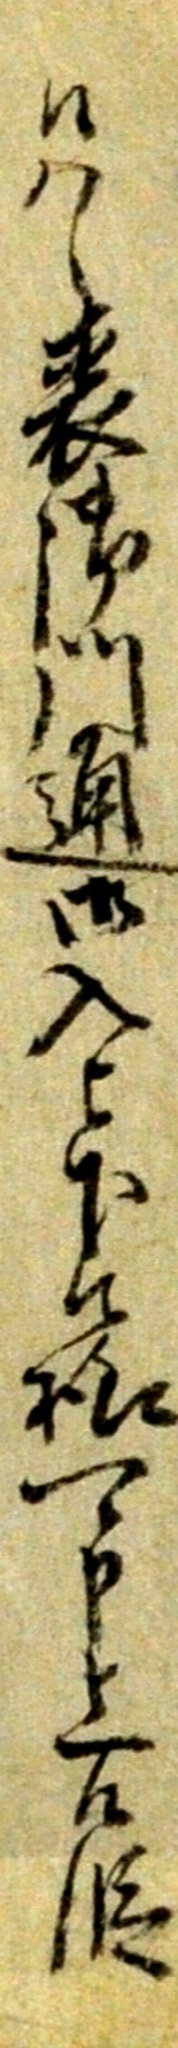候ハヽ表御門通御入被下候様可申上候段
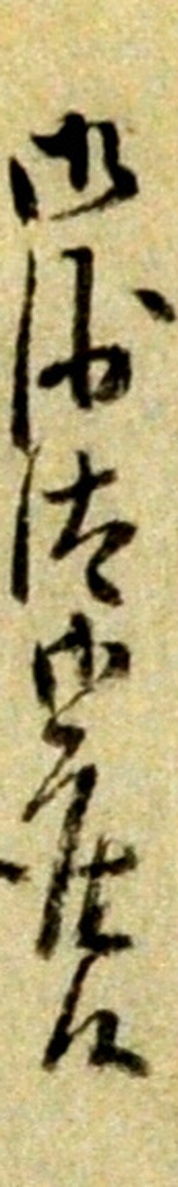御沙汰御座候
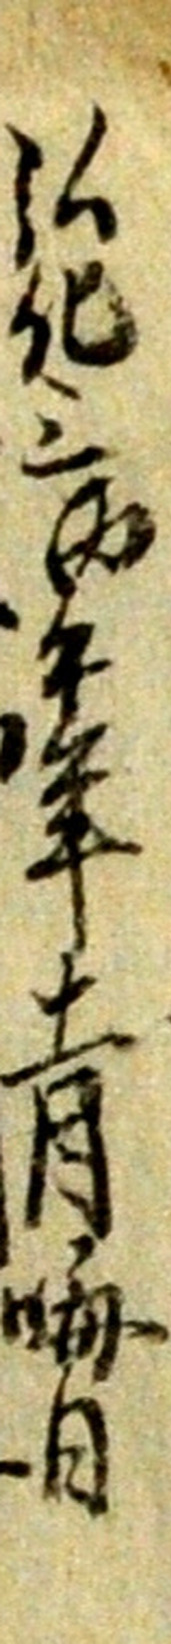弘化三丙午年十一月晦日
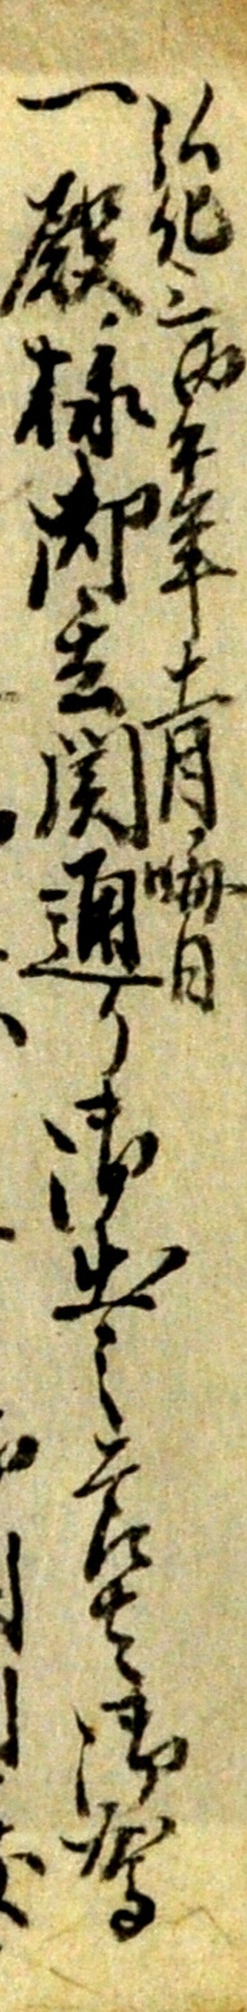一殿様御玄関通り御出之節者御駕
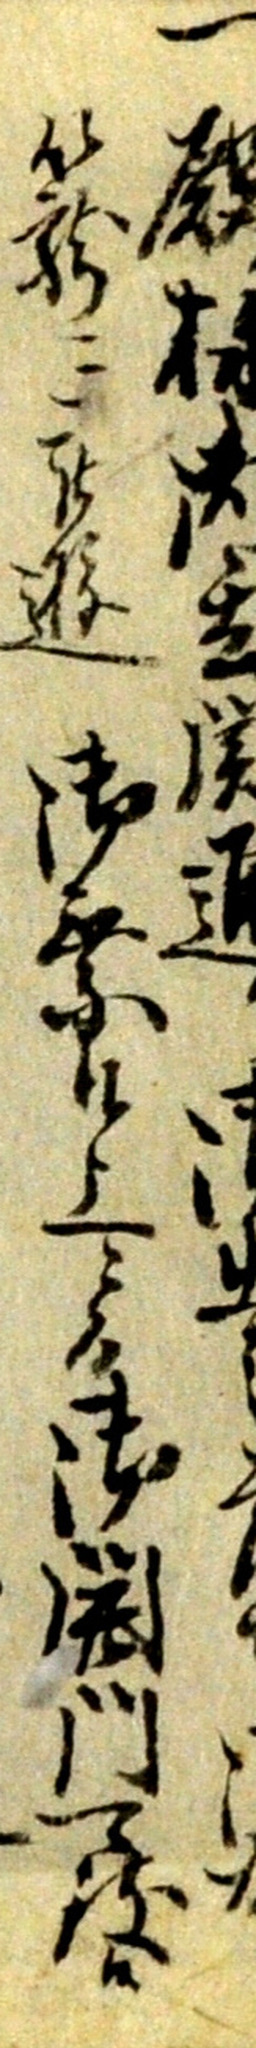籠ニ罷遊御乗候上ニ而御開門可致候
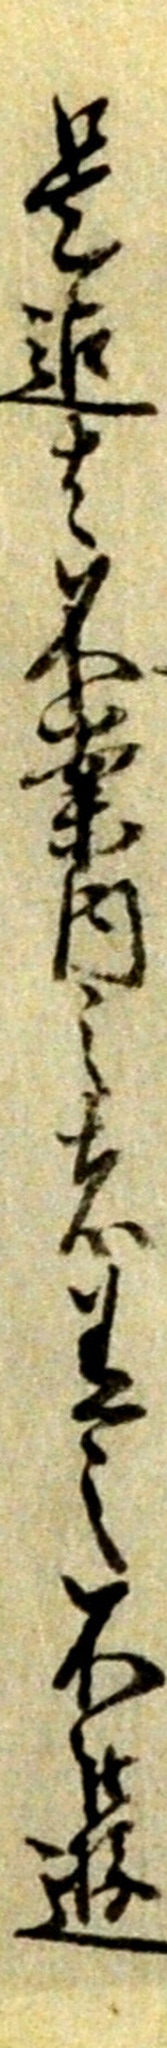是迄者不案内之者有之不被遊
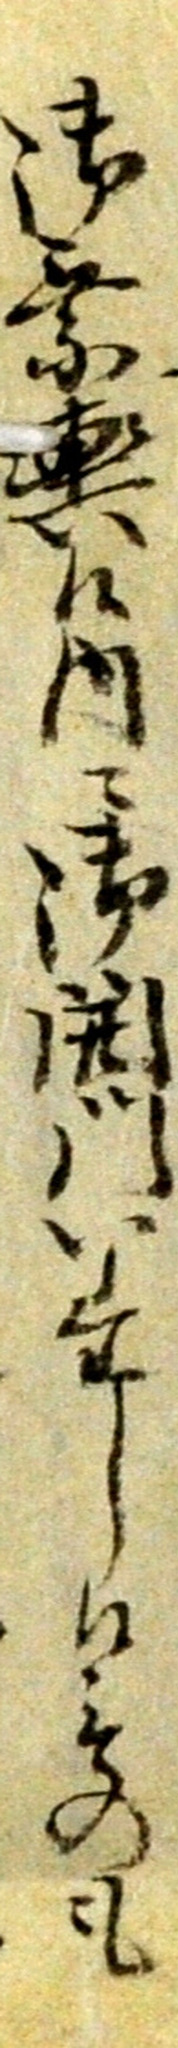御乗輿候内ニ御開門いたし候ものも
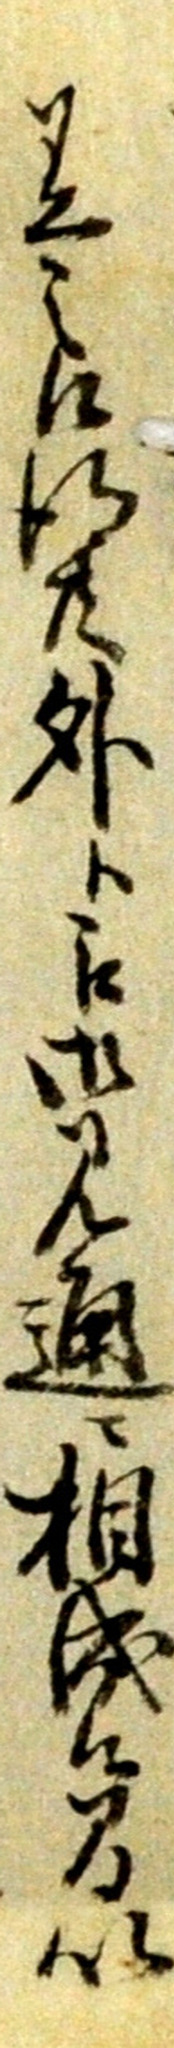有之候得共外ト江御見通ニ相成候間以
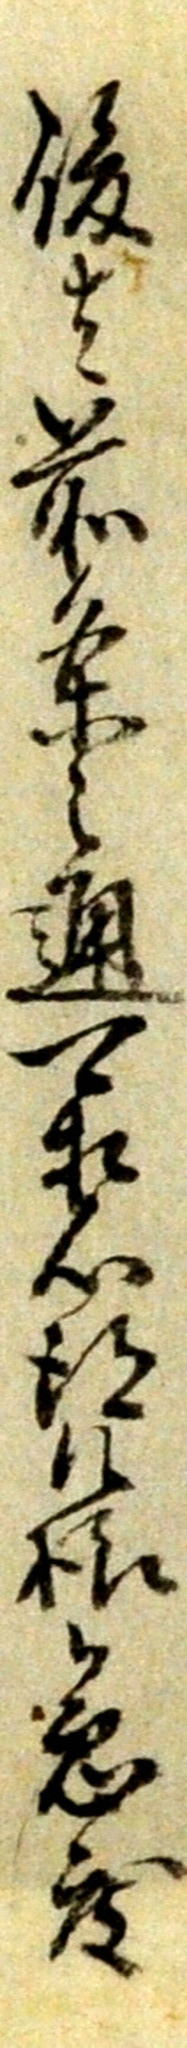後者前条之通可相心得候様急度
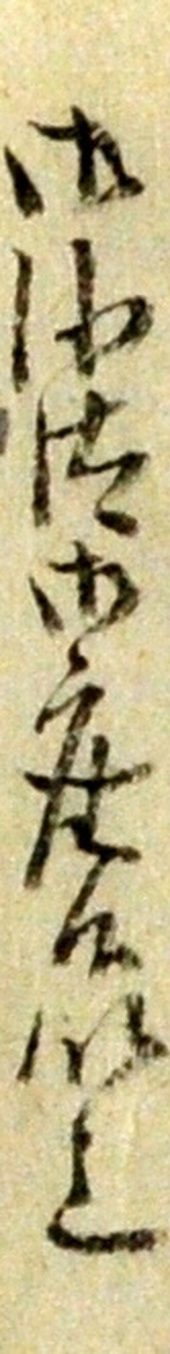御沙汰御座候以上
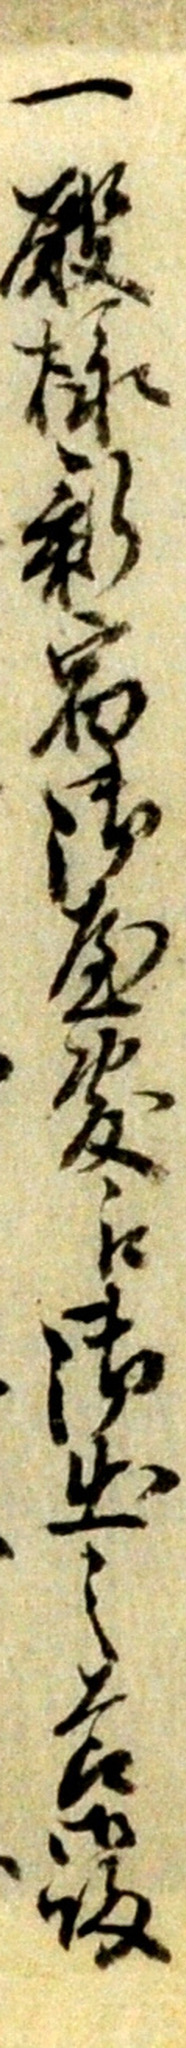一殿様新宿御屋敷江御出之節御帰
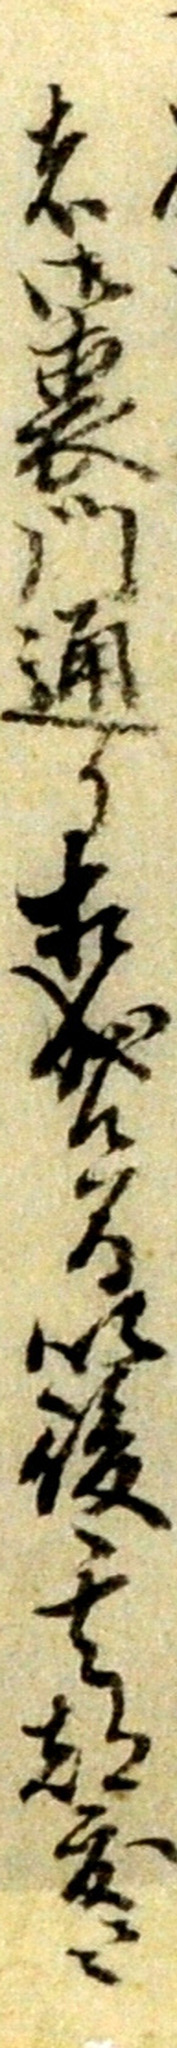者御裏門通り相成候間以後其都度云々
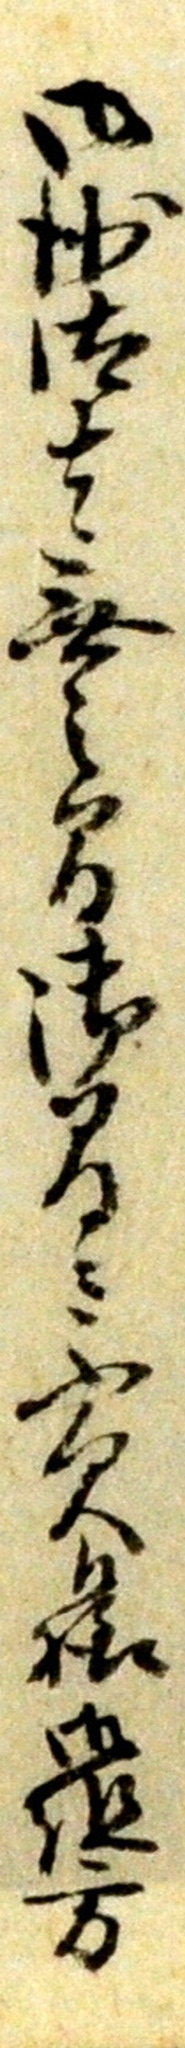御沙汰者無之間御間ニ不欠候様御組方
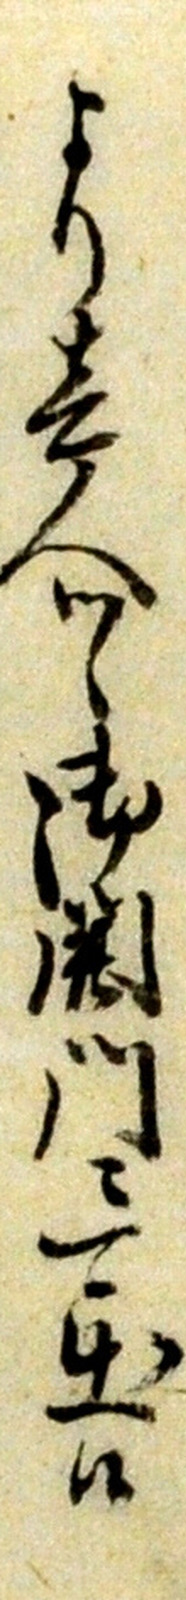より壱人ツヽ御開門ニ可出候
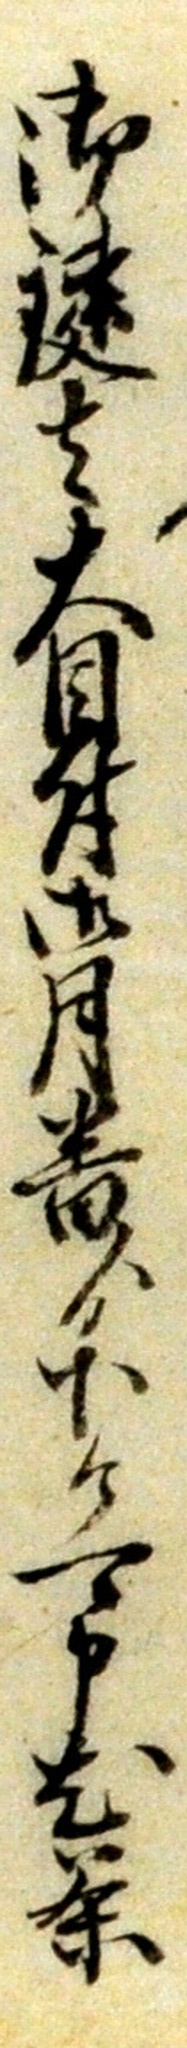御鍵者大目付御月番ゟ下ケ可申尤茶
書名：御先手組江戸御屋敷御門番勤方
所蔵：伊那市立高遠町図書館・合同会社AMANE
